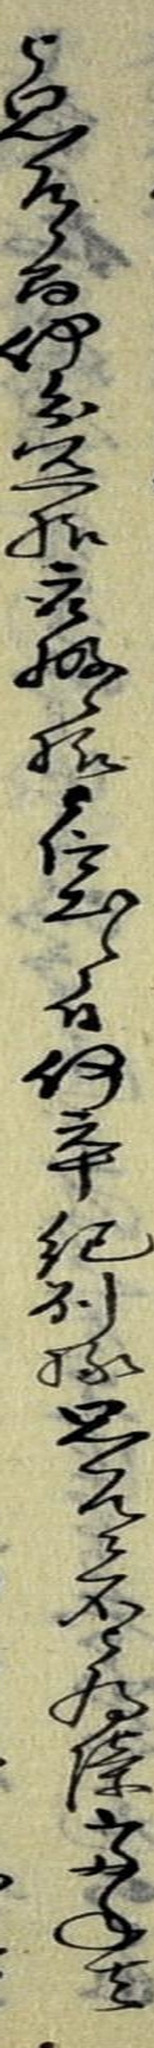被思召候間何分宜様取扱候様被仰出候に付何卒紀州様思召に不被為障当年は
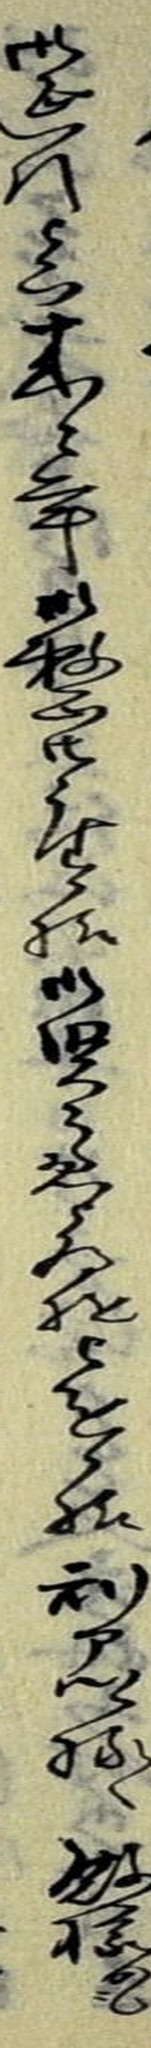御延引被下来々年御整御座候様に御賢慮被為遊被進候様刑部卿様へ殿様ゟも
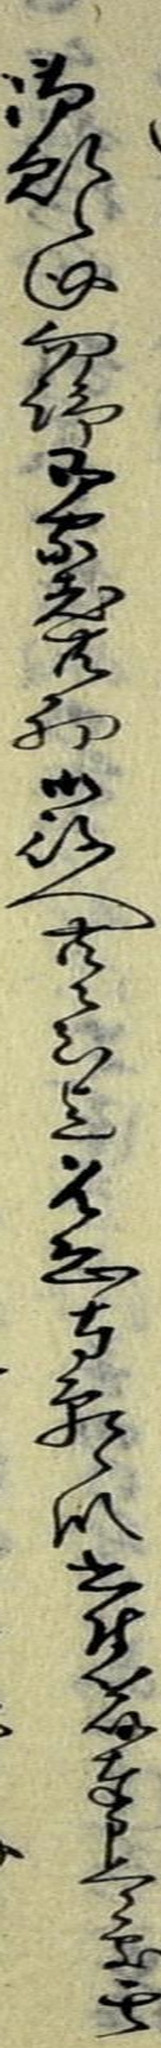御願之趣勿論御家老共初御役人共に至迄乍恐奉願候段書付を以奉申上候処其
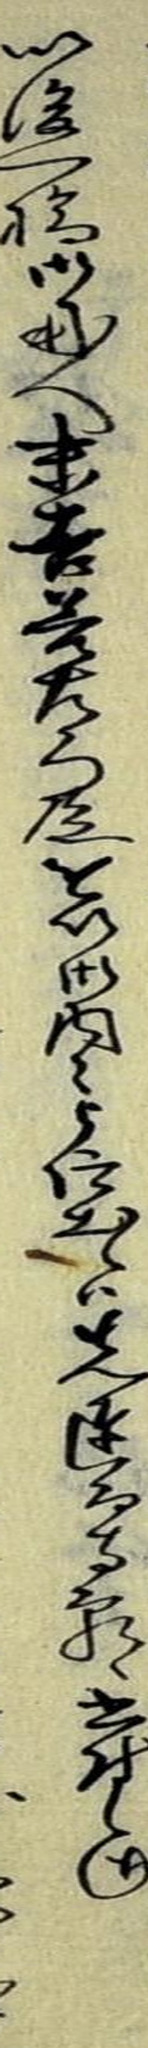以後一橋御用人末吉善左衛門殿を以御内々被仰出候は先達而奉願候書付之趣
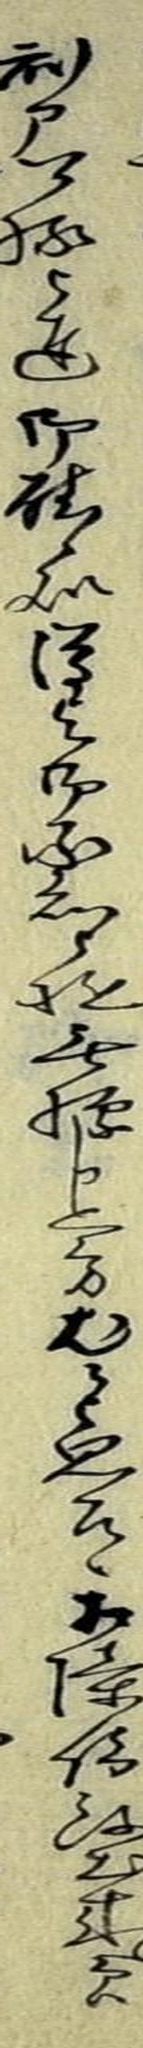刑部卿様被達御聴候処得与御承知被遊無拠申上方尤に被思召候相障儀致出来候而は
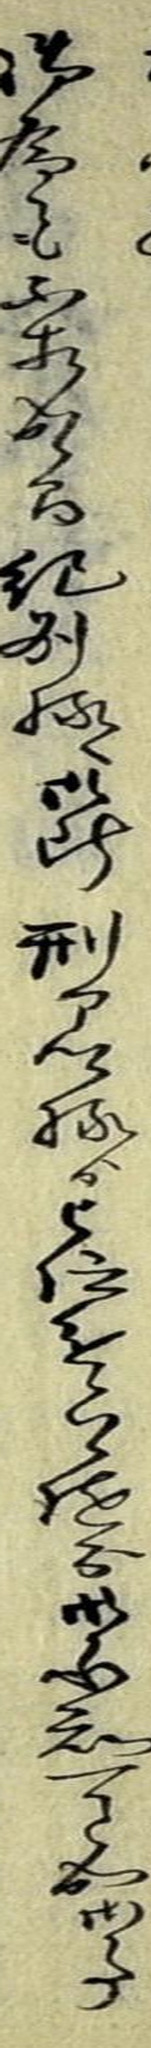御為にも不相成候間紀州様へ御断刑部卿様ゟ被仰進候はゝ随分御承知可被成御事
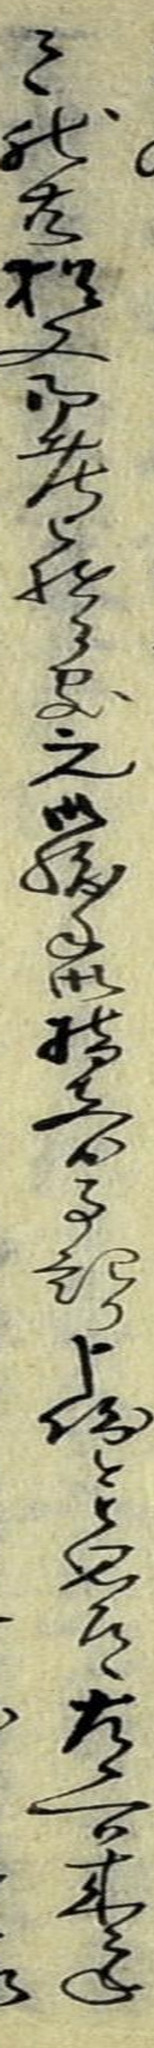に候然共猶又御考被遊候処元御勝手御指支ゟ事起り申儀と被思召候左候へは来々年
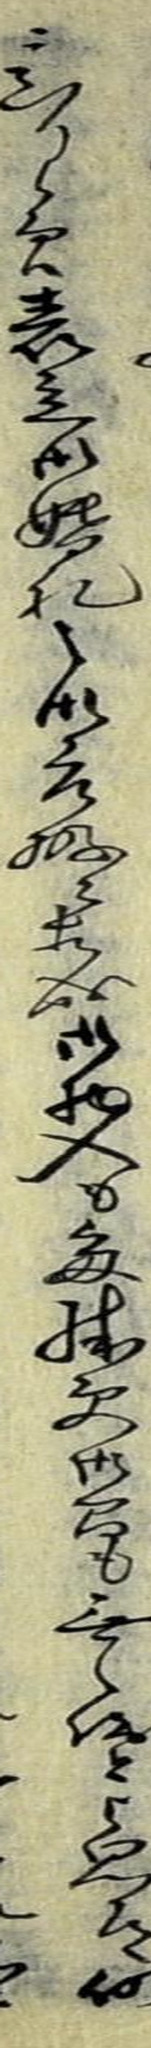に至り候而は表立御婚礼之御取扱に相成御物入も多殊更御間も無之儀と被思召候仍
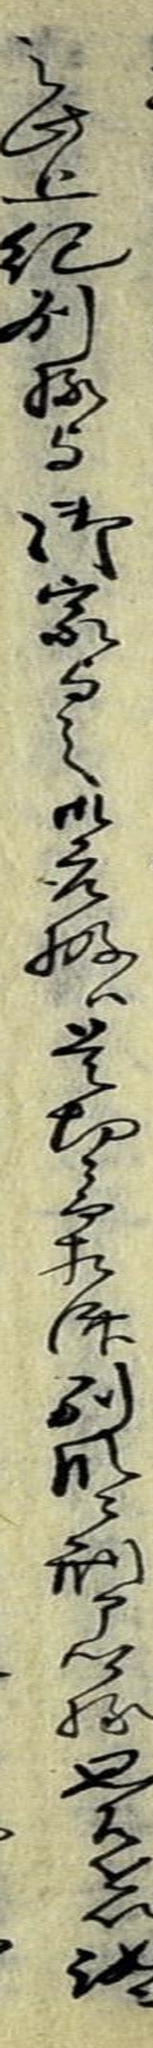之此上紀州様と御家と之御取扱は是切に而相済別段に刑部卿様思召を以誠に
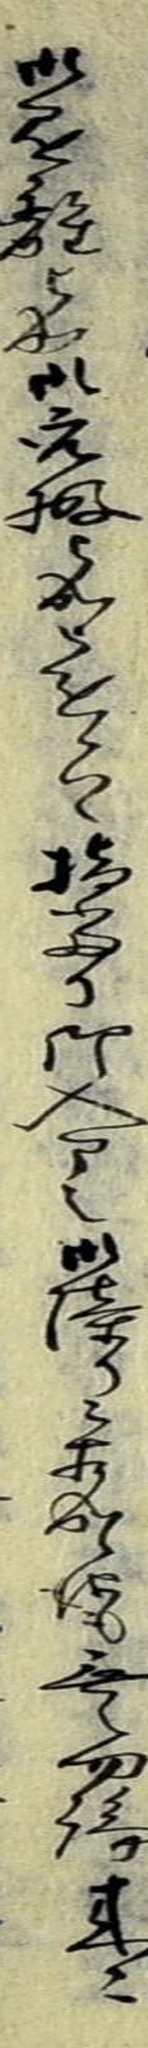御懸離被成御取扱被成被進候はゝ指当り御入部之御障りに相成候儀も無之勿論来々
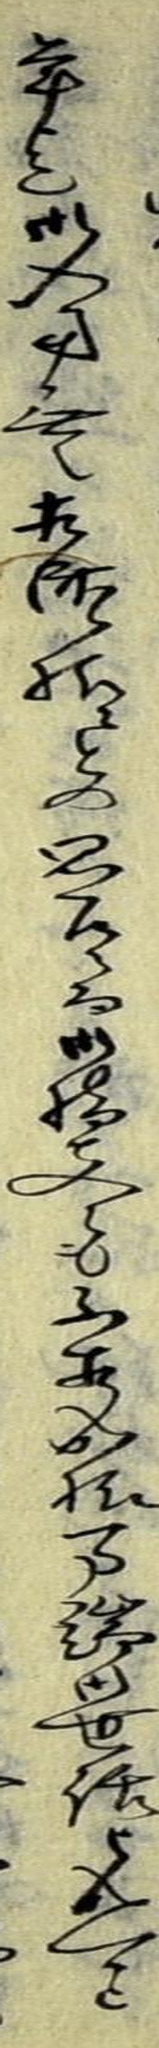年迄御入用無之相済候様にとの思召に而御指支にも不相成様万端御世話被成可被
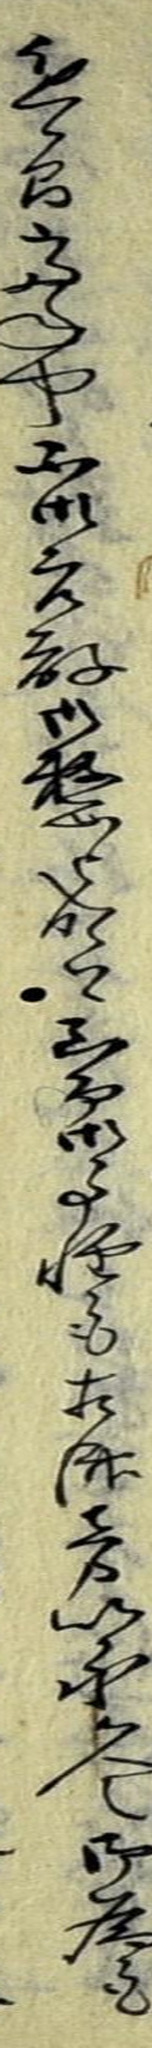進候間当年中不御取扱御整被成候はゝ至而事軽にも相済旁以永久之御為にも
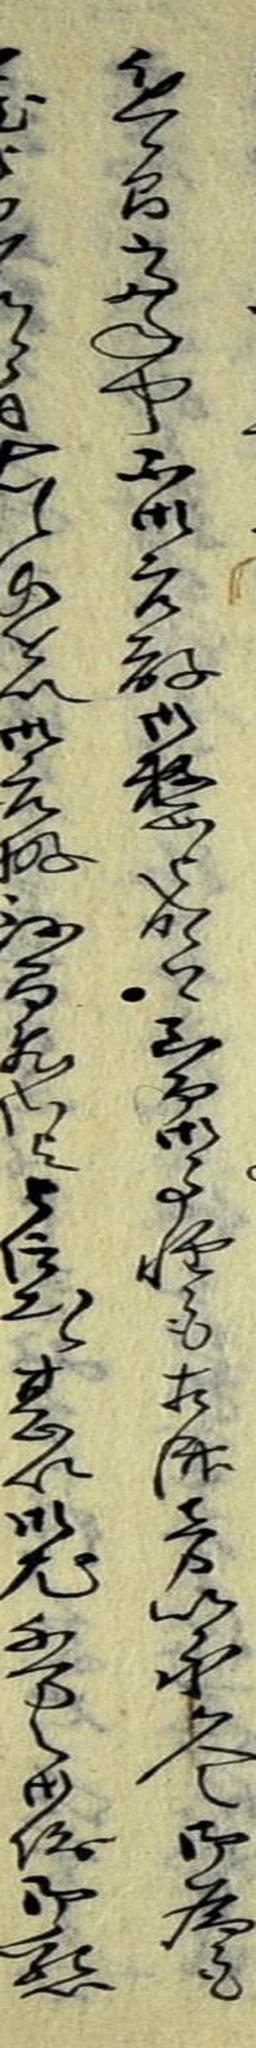可然被思召候に付右之趣を以御取扱致間敷哉と被仰出候甚以御尤千万之御儀御懇
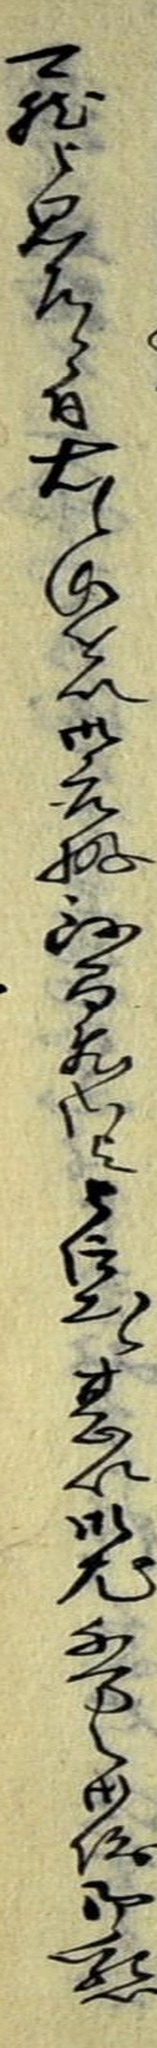可然被思召候に付右之趣を以御取扱致間敷哉と被仰出候甚以御尤千万之御儀御懇

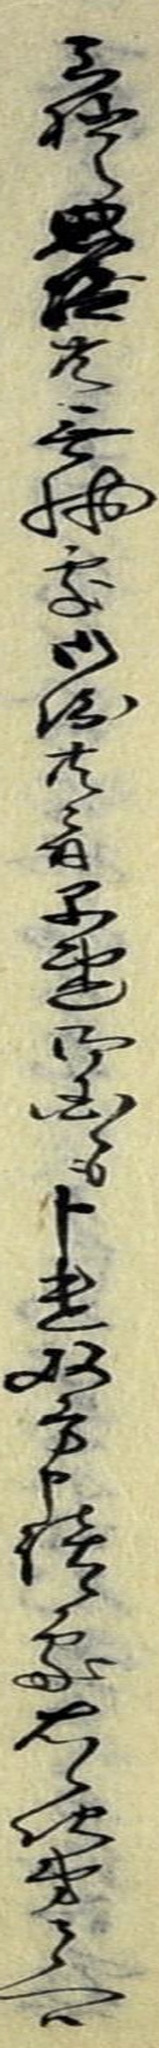至極之思召共無拠処御儀共に付早速御国へも申遣双方申談候処右之次第に候へは
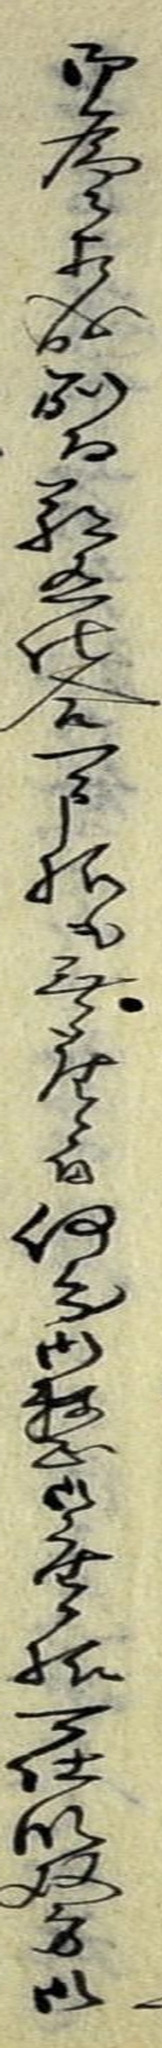御為に相成別而難有仕合可申様も無御座候に付何分御整御座候様可仕段双方御
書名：命令之部 二
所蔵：福井県文書館 Fukui Prefectural Archives
